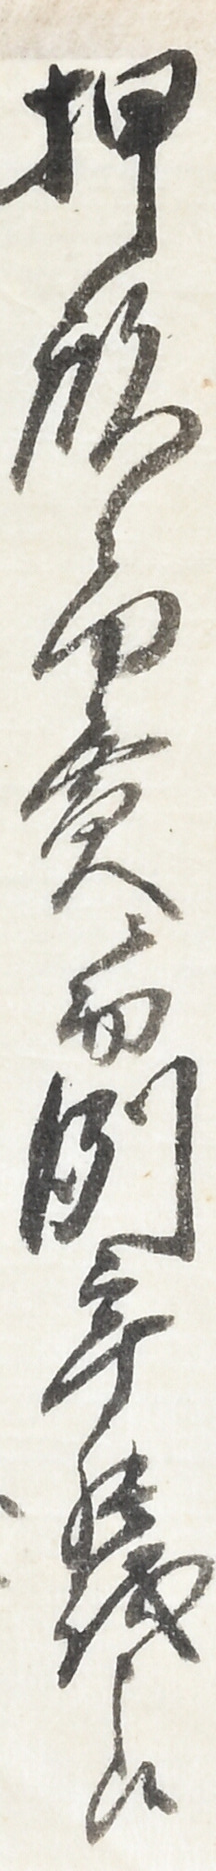押形商売ニ而例年罷越申候

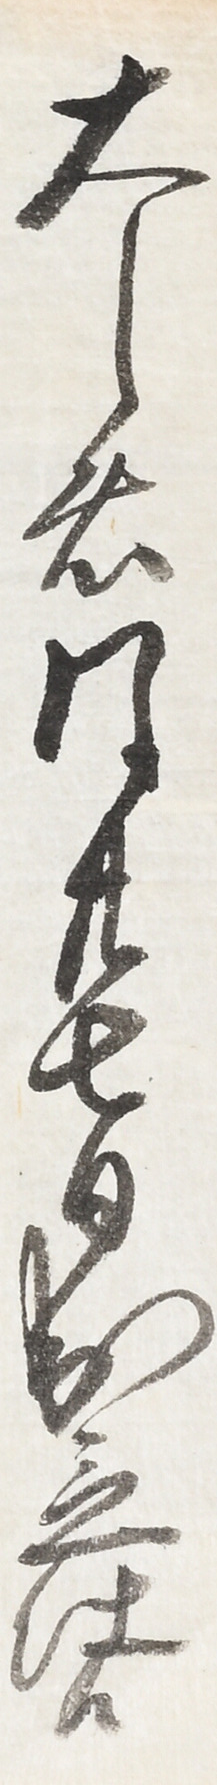右之者同廿七日出立仕候
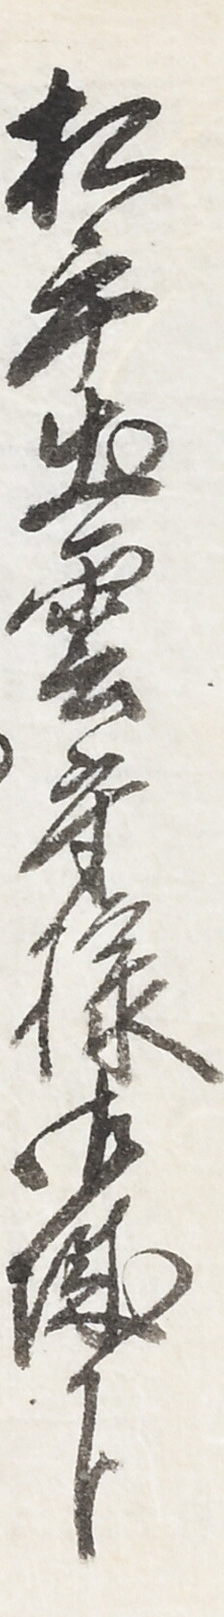松平出雲守様御城下
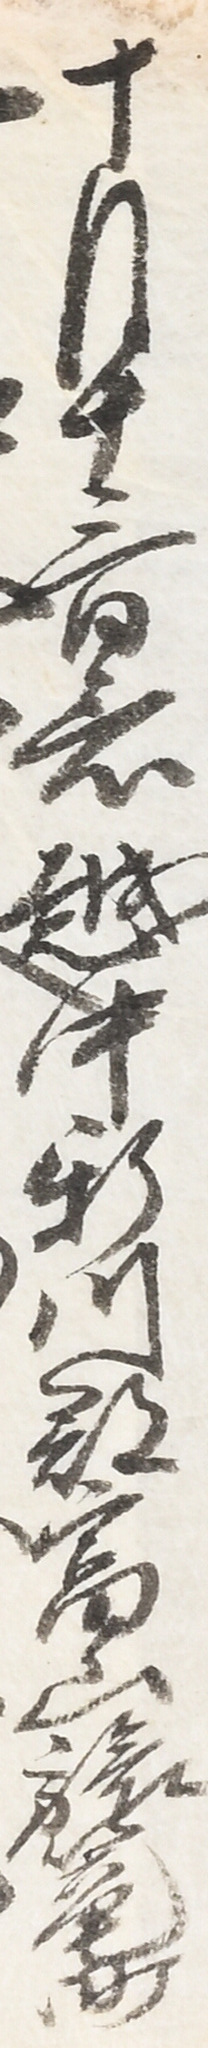十月十三日着越中新川郡富山旅籠町
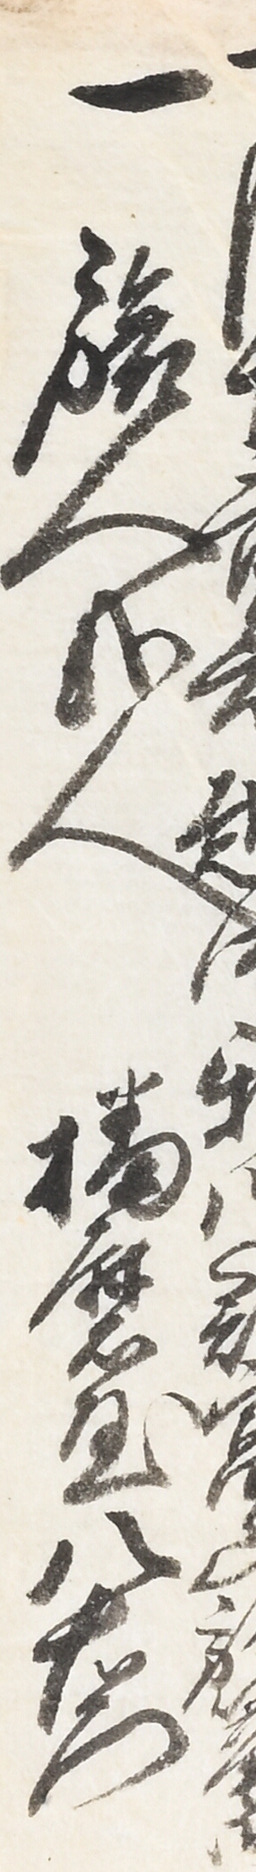一旅人弐人播磨屋八右衛門
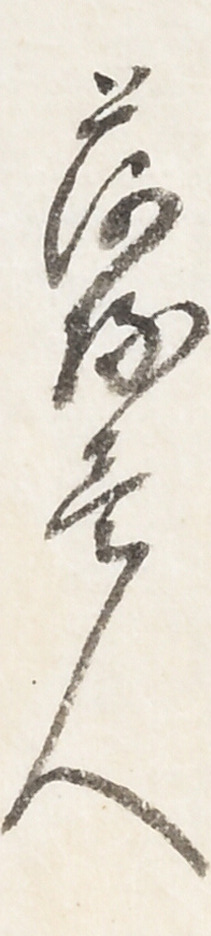荷持壱人
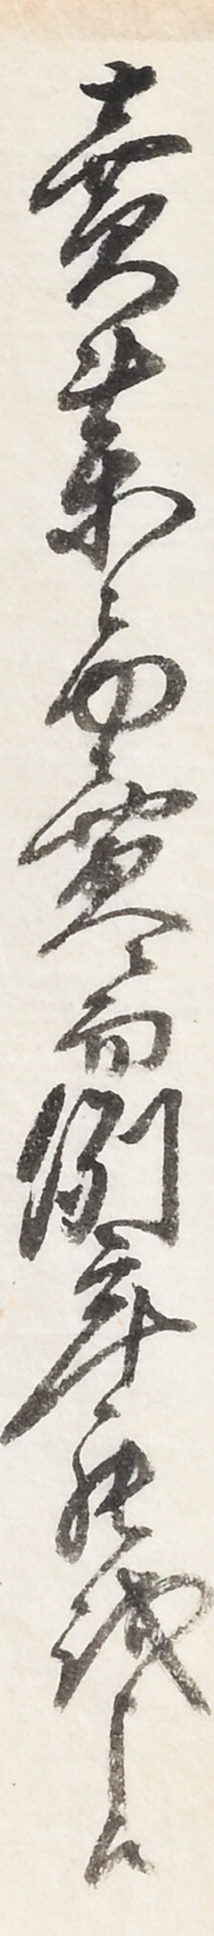売薬商売ニ而例年罷越申候
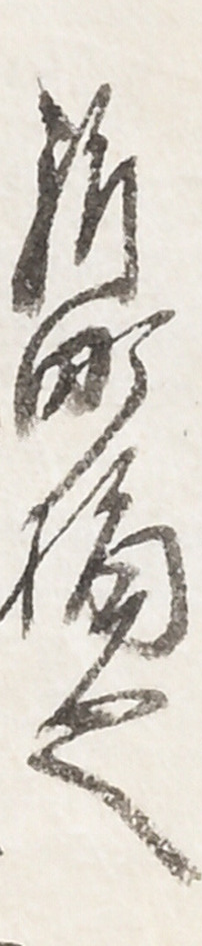新町桶や
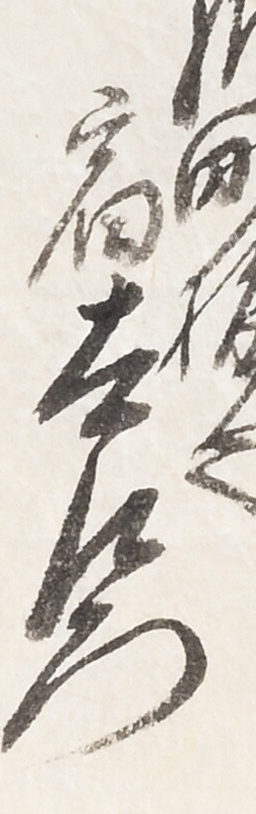宿太左衛門
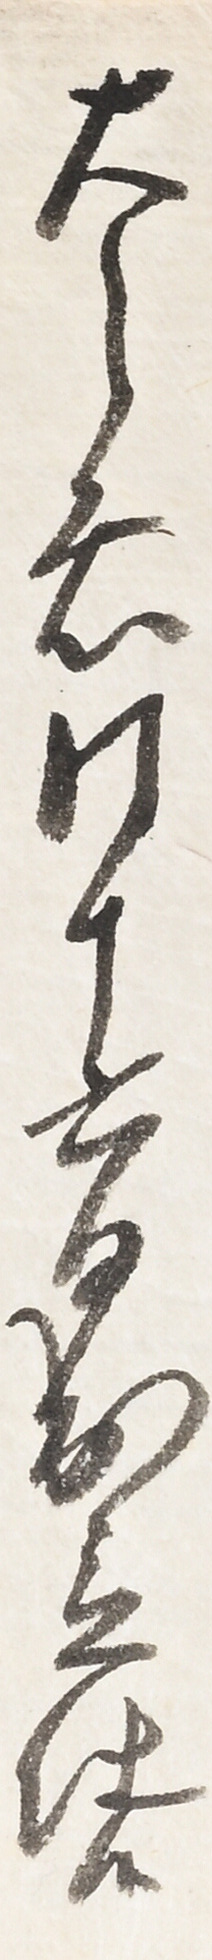右之者同十六日出立仕候
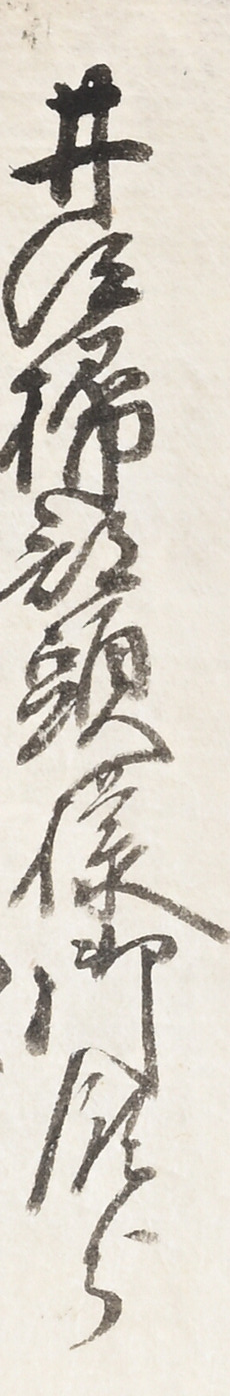井伊掃部頭様御領分
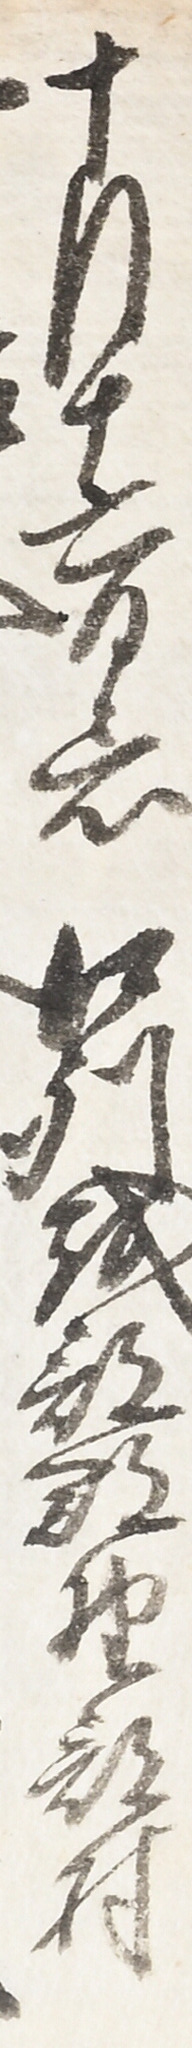十月十六日着江州越部郡野部村
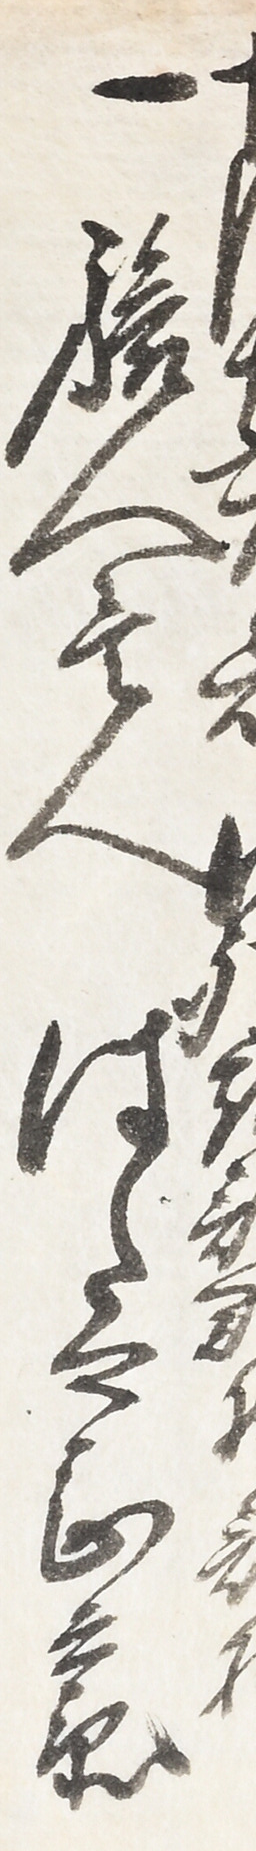一旅人壱人はたや甚兵衛
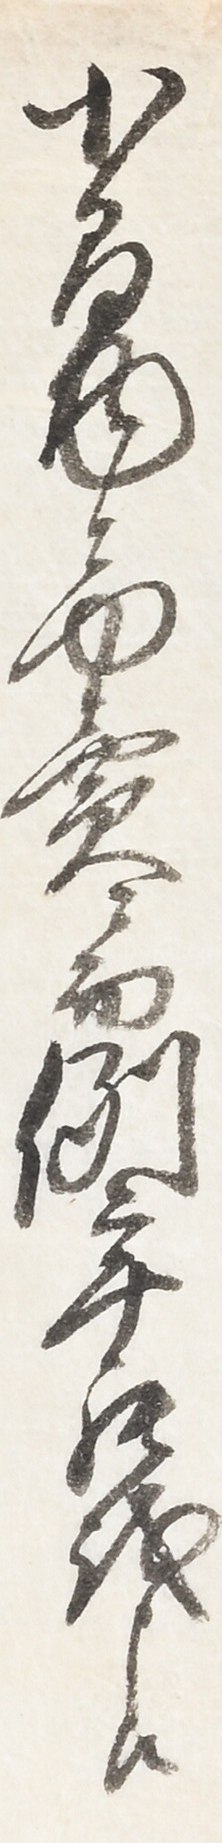小間物商売ニ而例年罷越申候
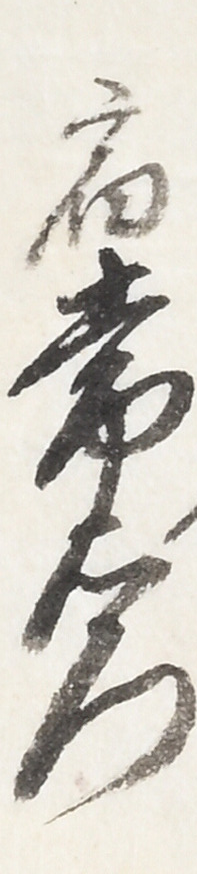宿常右衛門
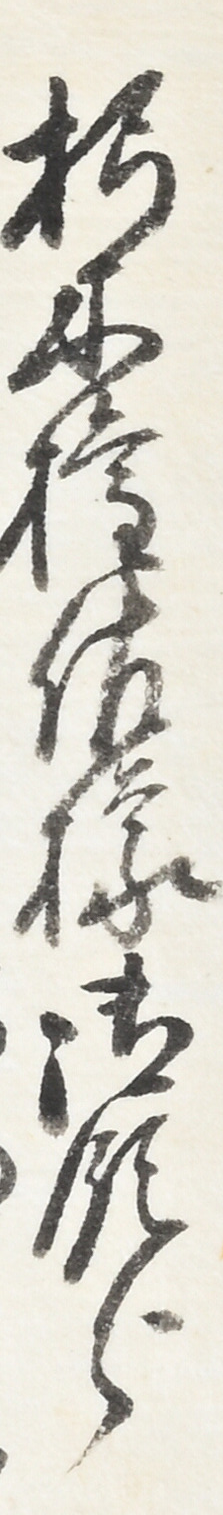朽木権佐様御領分
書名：旅人泊控帳
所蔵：伊那市立高遠町図書館・合同会社AMANE
